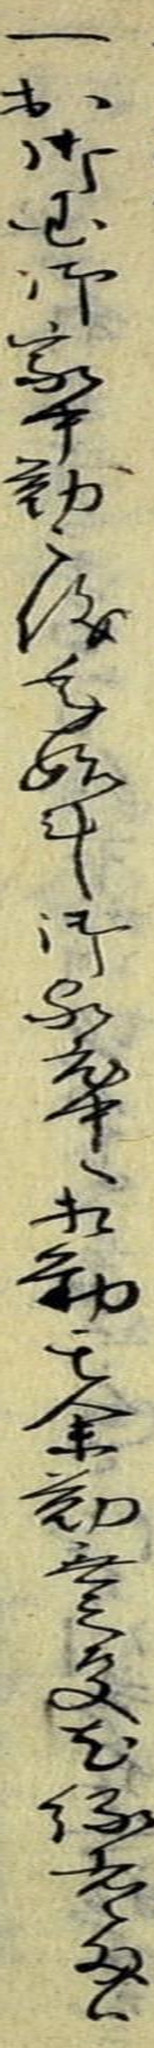一於御国御家中勤之儀年始斗御家老中へ相勤其余勤無之事尤縁者之義ハ
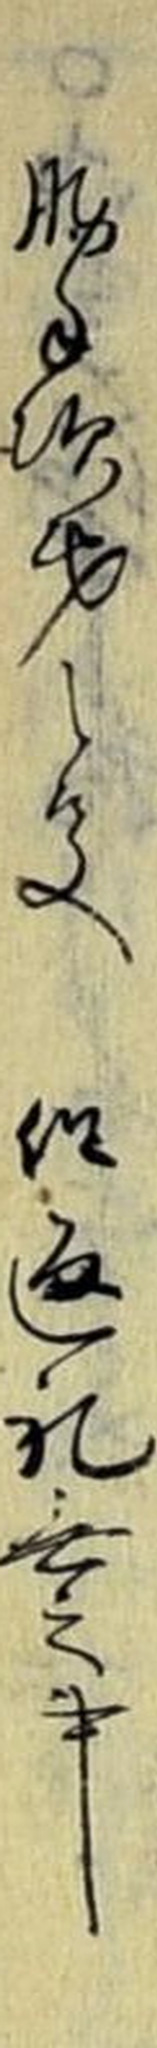勝手次第之事但返礼無之事
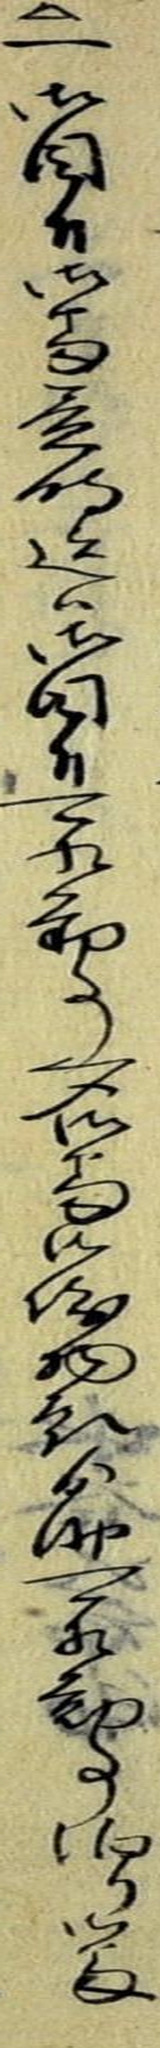△一御目付御番昼時迄ハ御目付可相勤事夕御番御側物頭ゟ助可相勤事泊り番
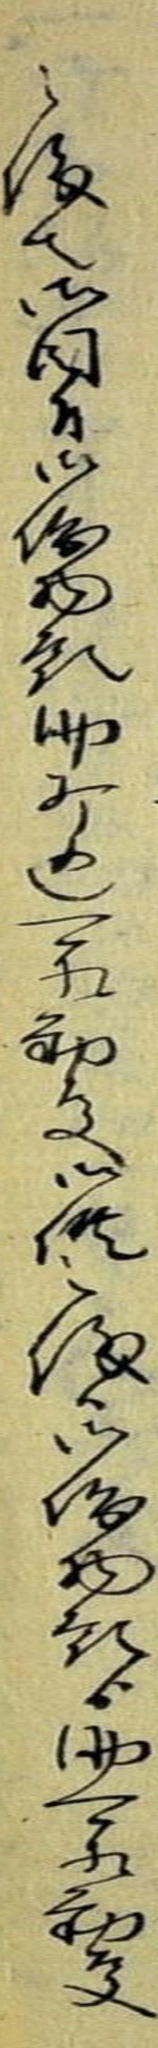之儀者御目付御側物頭助打込可相勤事御供之儀ハ御側物頭ゟ助可相勤事
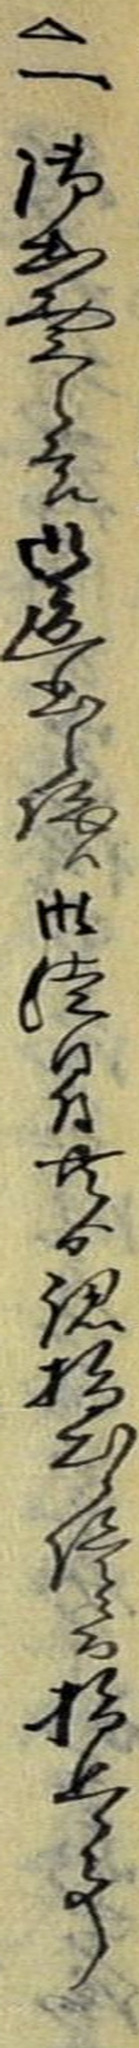△一御出殿之節御道書之儀ハ御徒目付共ゟ認指出候儘ニ而指上候事
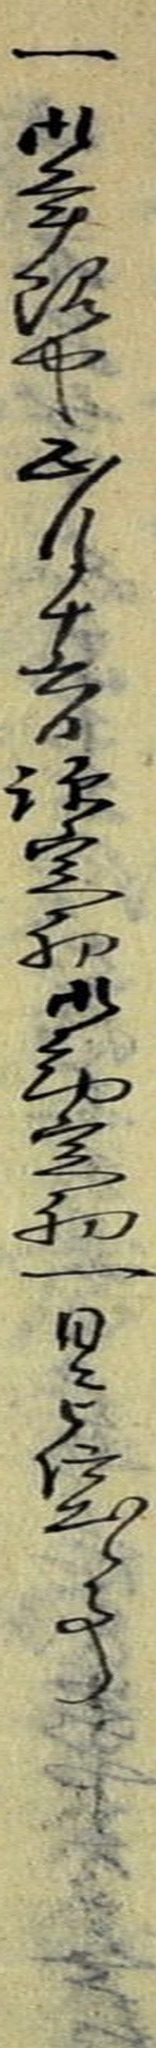一御年限中正月十六日評定初御勘定初一日ニ被仰出候事
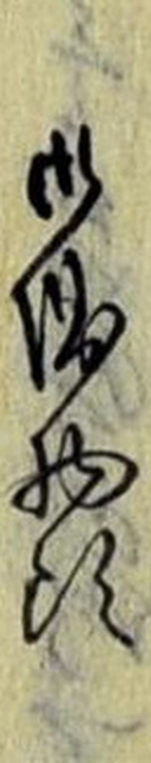御側物頭
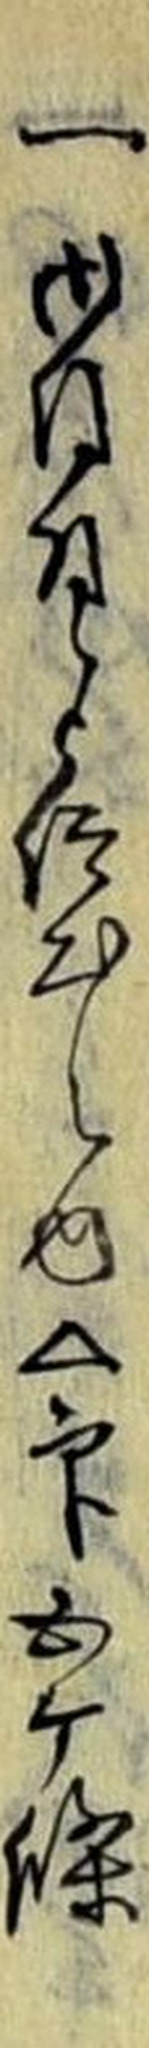一御目付へ被仰出候内△印五ケ条
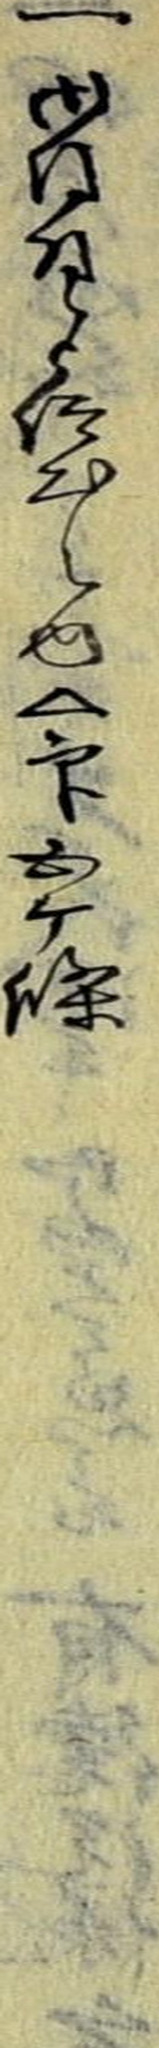一御目付へ被仰出候内△印五ケ条
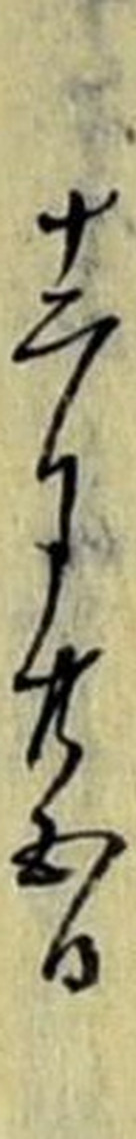〆十二月廿五日
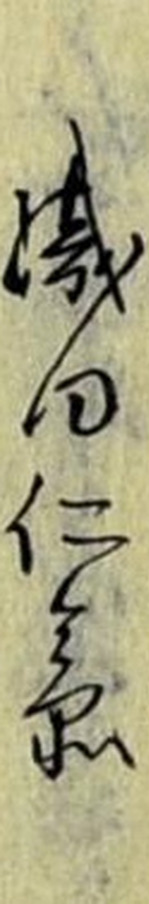織田仁兵衛
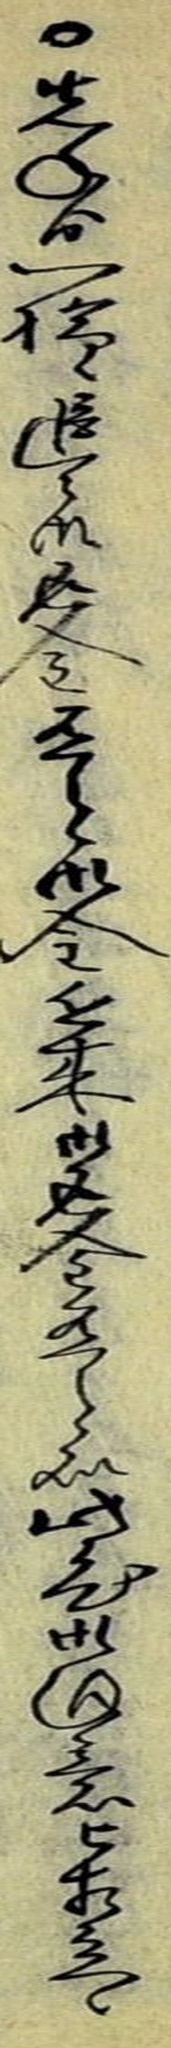〇先年ゟ一橋へ追々御返金有之候御金近来御返金有之候処此度御趣意被相立候
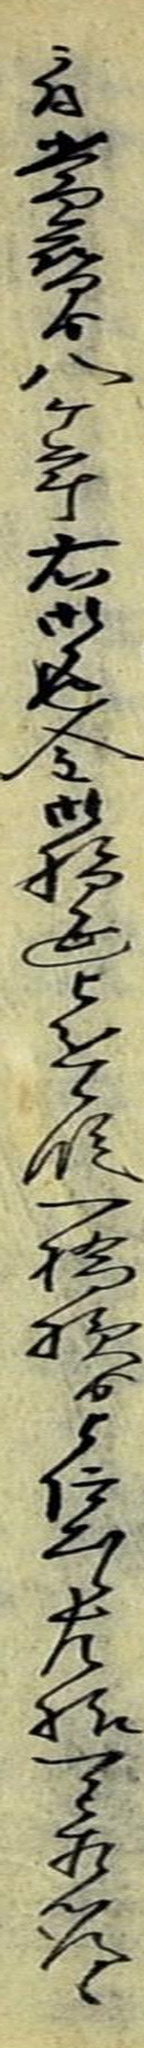ニ付当暮ゟ八ケ年右御返金御指延被遊候段一橋様ゟ被仰出候左様可被相心得候
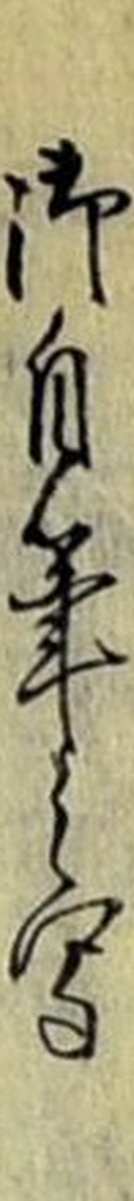御自筆之写
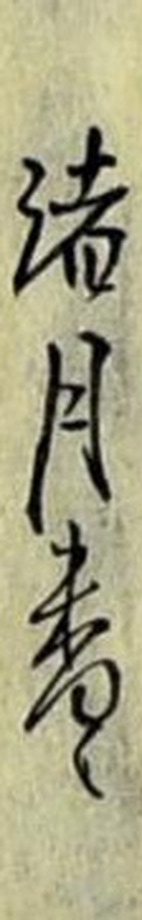諸月番へ
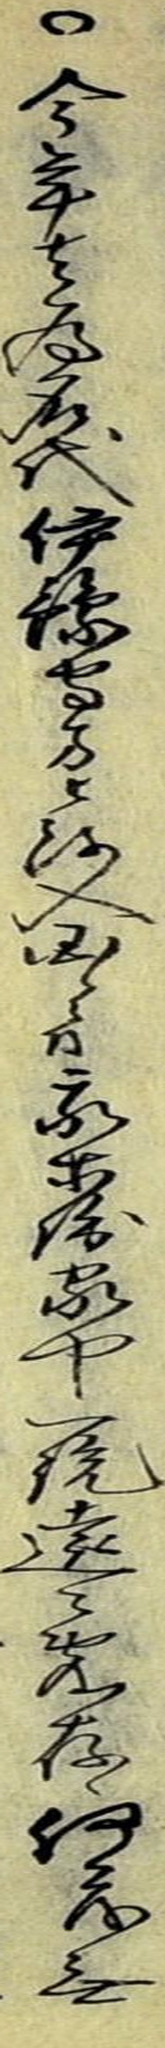〇今年者為名代伊予守方被致入国候ニ付我等儀家中一統遠々敷存候何茂無
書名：命令之部 三
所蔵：福井県文書館 Fukui Prefectural Archives
